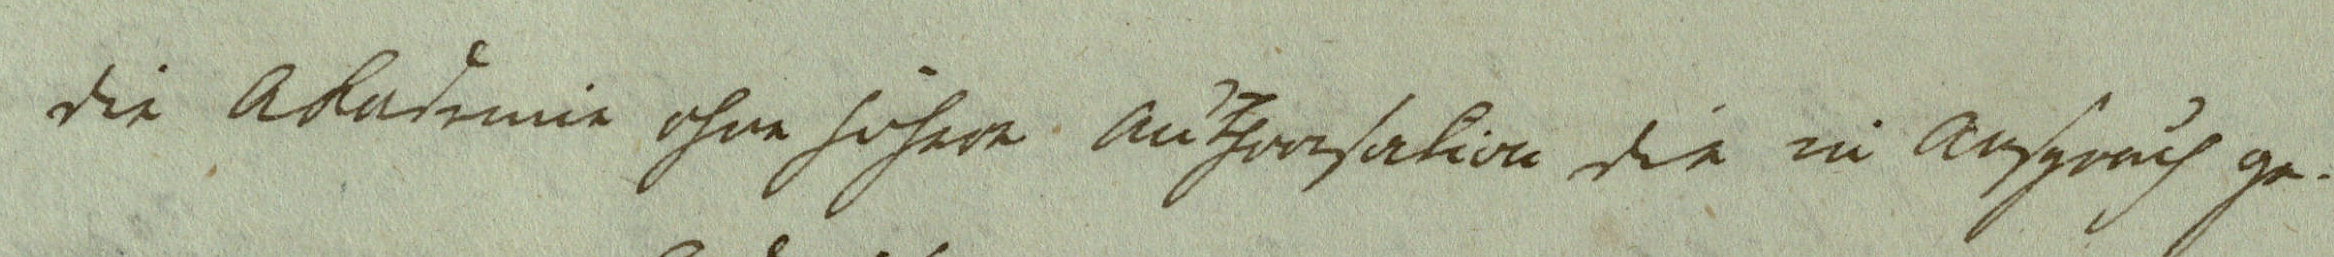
die Akademie ohne höhere Authorisation die in Anspruch ge¬
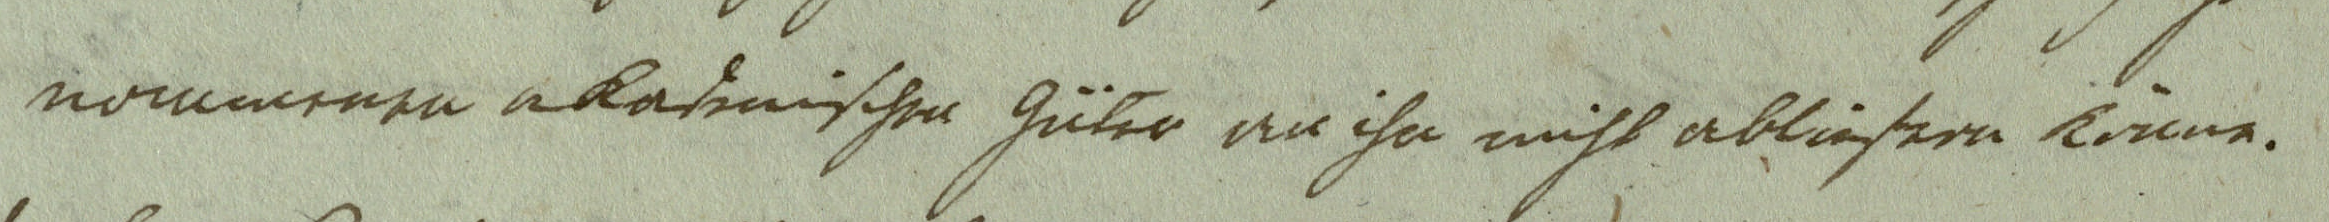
nommenen akademischen Güter an ihn nicht abliefern könne.
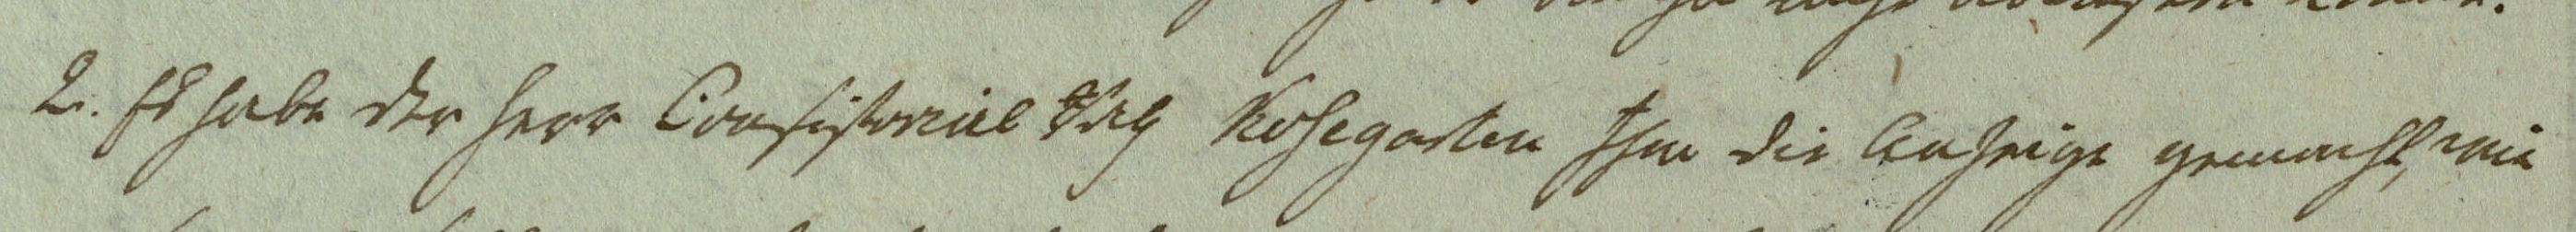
2. Es habe der herr Consistorial Rath Kosegarten Ihm die Anzeige gemacht, wie
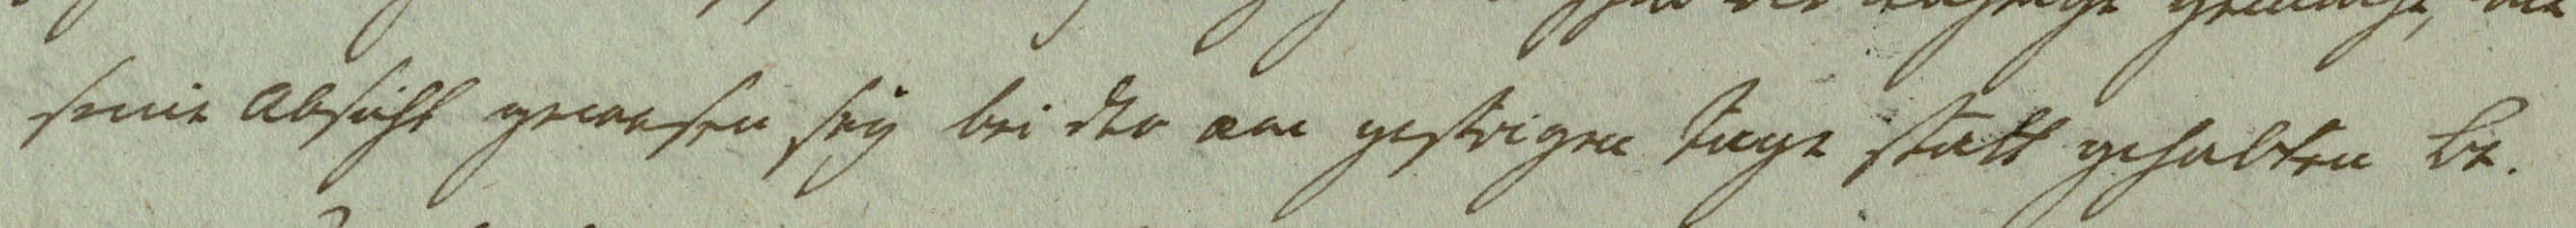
seine Absicht gewesen seÿ bei der am gestrigen Tage statt gehabten Be¬
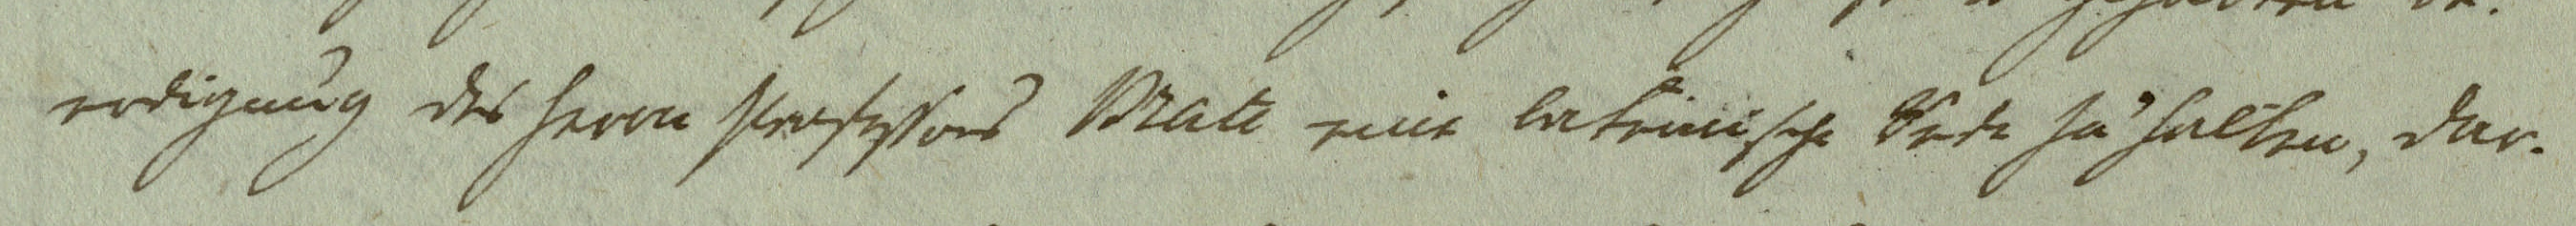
erdigung des herrn Professors Bratt eine lateinische Rede zu halten, dar¬
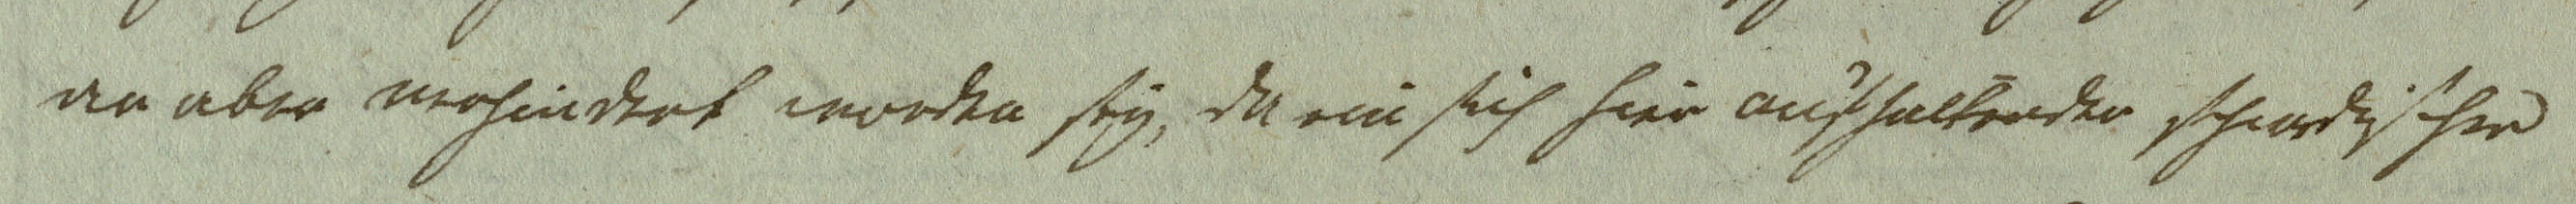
an aber verhindert worden seÿ, da ein sich hier aufhaltender schwedischer
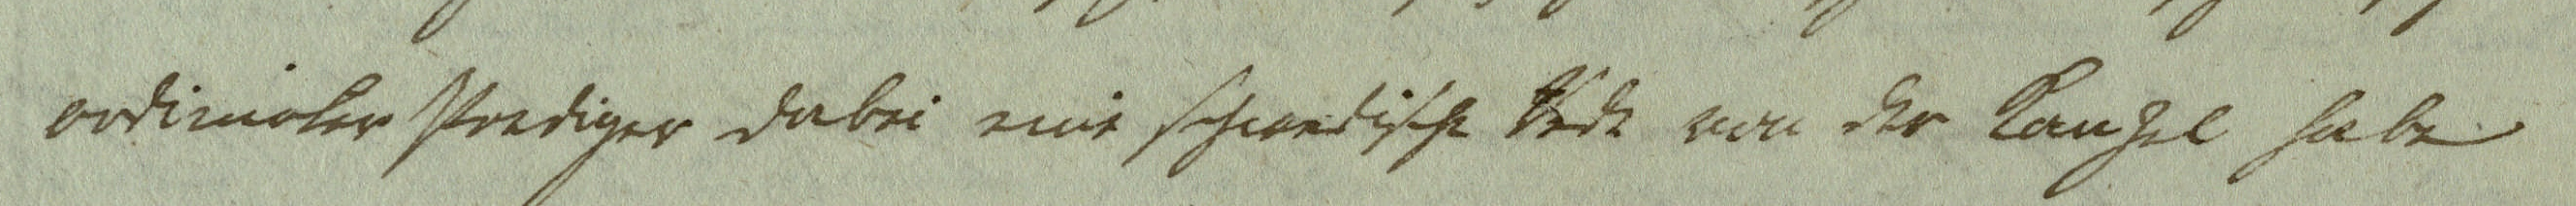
ordinirter Prediger dabei eine schwedische Rede von der Kanzel habe
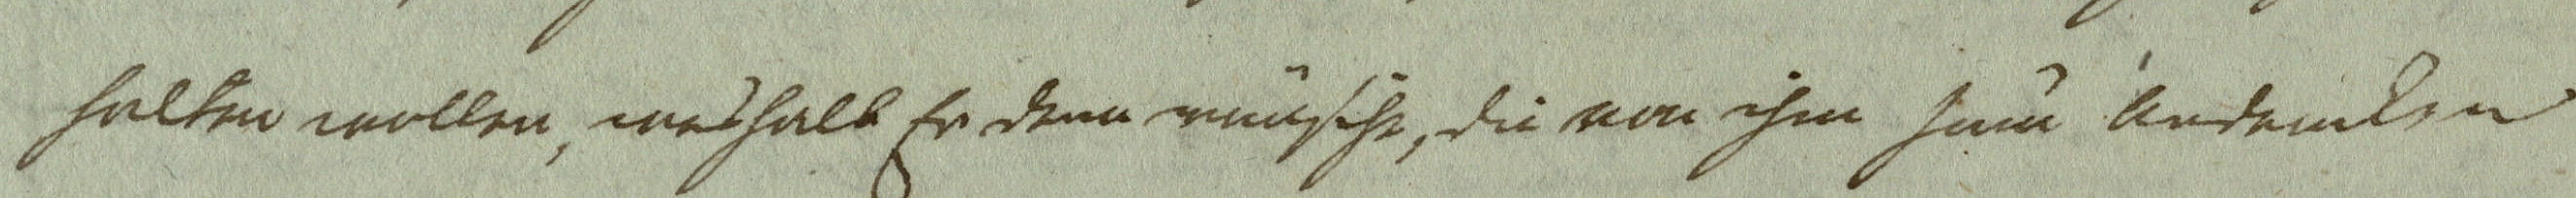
halten wollen, weshalb Er denn wünsche, die von ihm zum Andencken
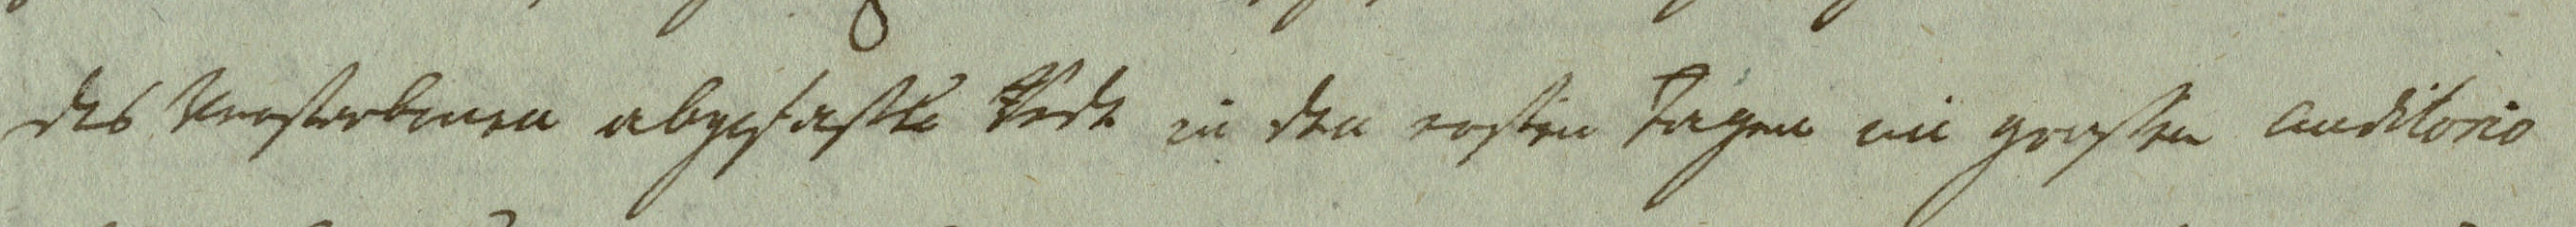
des Verstorbenen abgefaßte Rede in den ersten Tagen im großen Auditorio
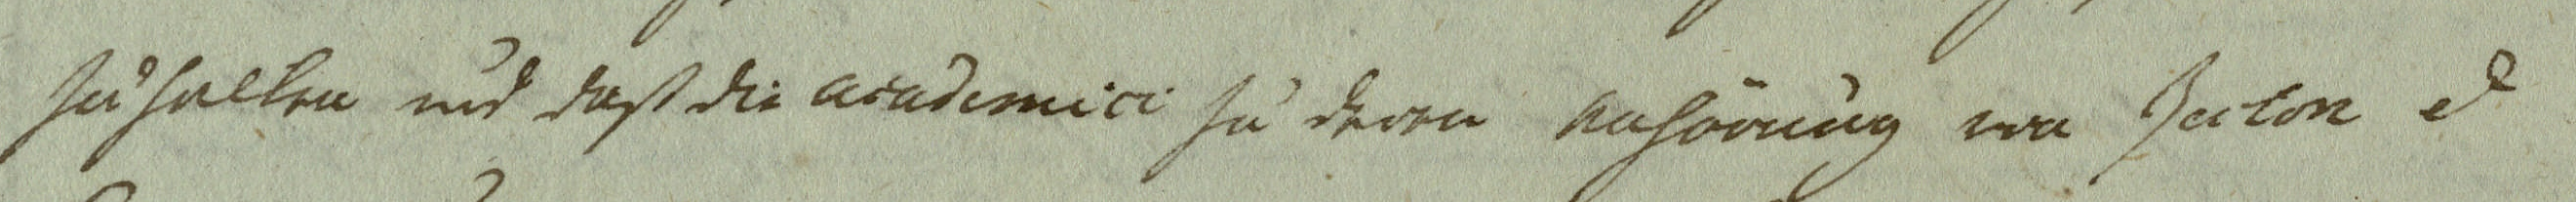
zu halten und daß die Academici zu deren Anhörung von Rectore et
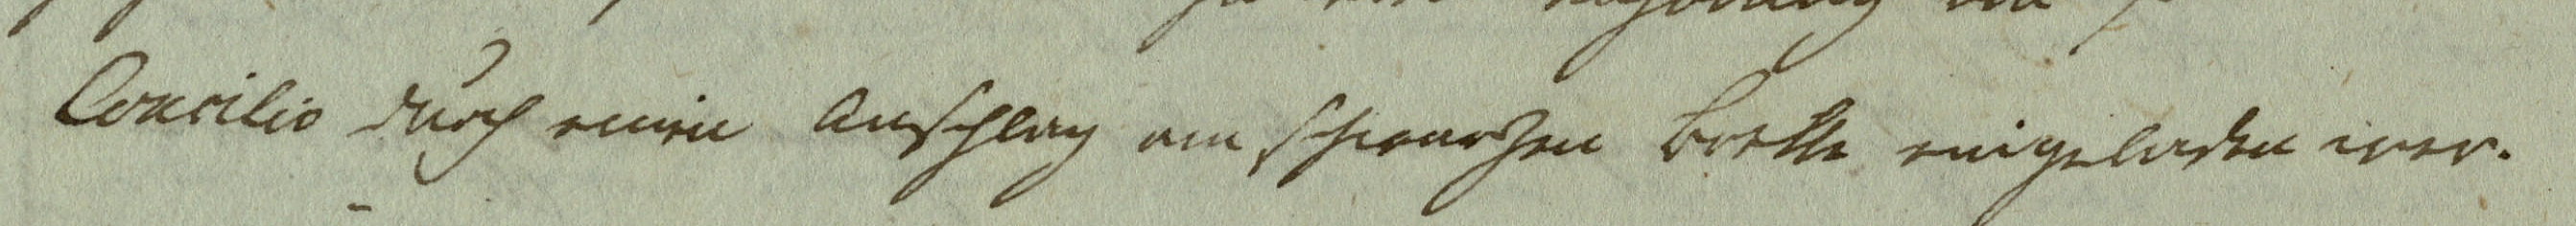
Concilio durch einen Anschlag am schwarzen Brette eingeladen wer¬
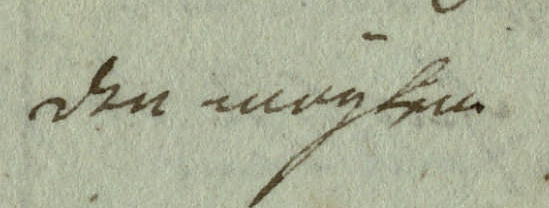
den mögten.
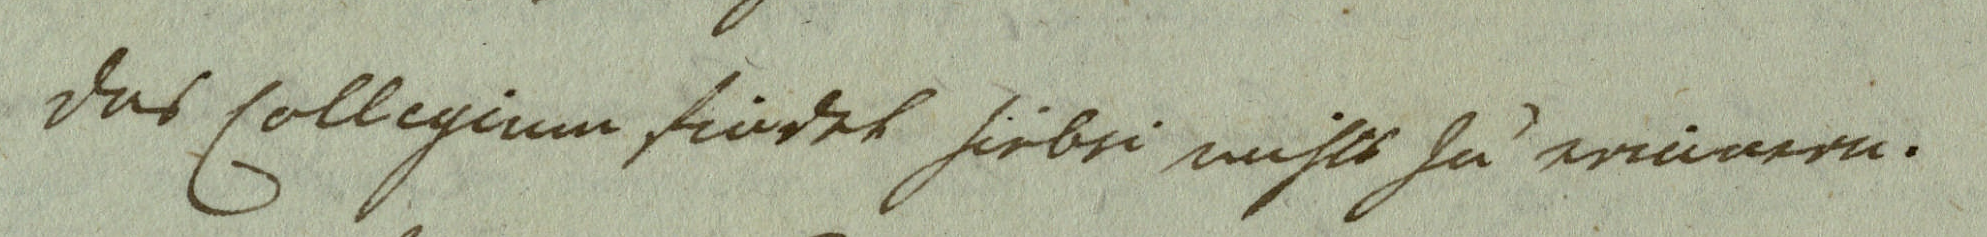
Das Collegium findet hiebei nichts zu erinnern.
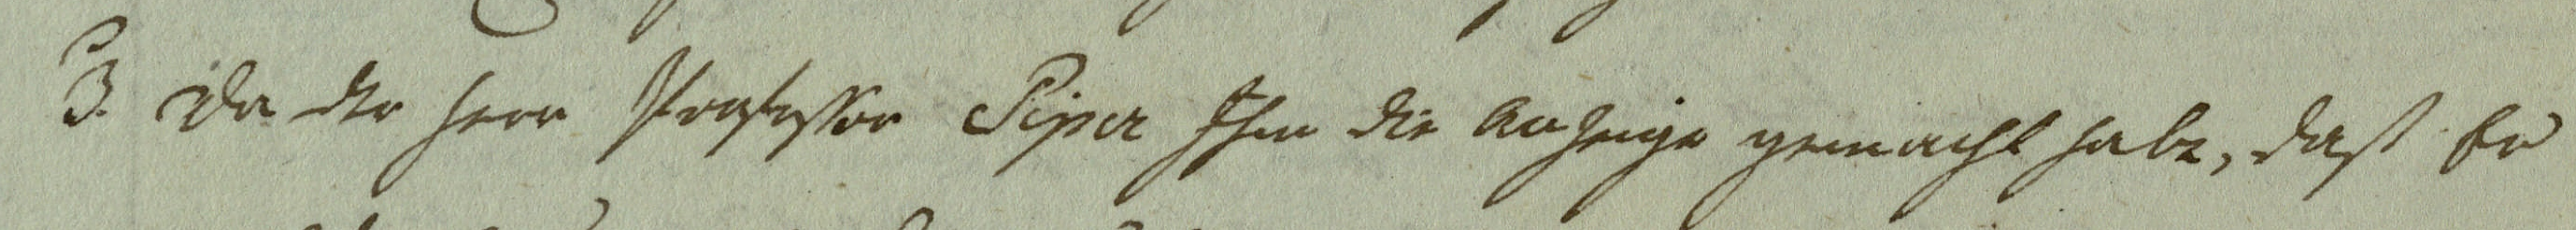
3. Da der herr Professor Piper Ihm die Anzeige gemacht habe, daß Er
